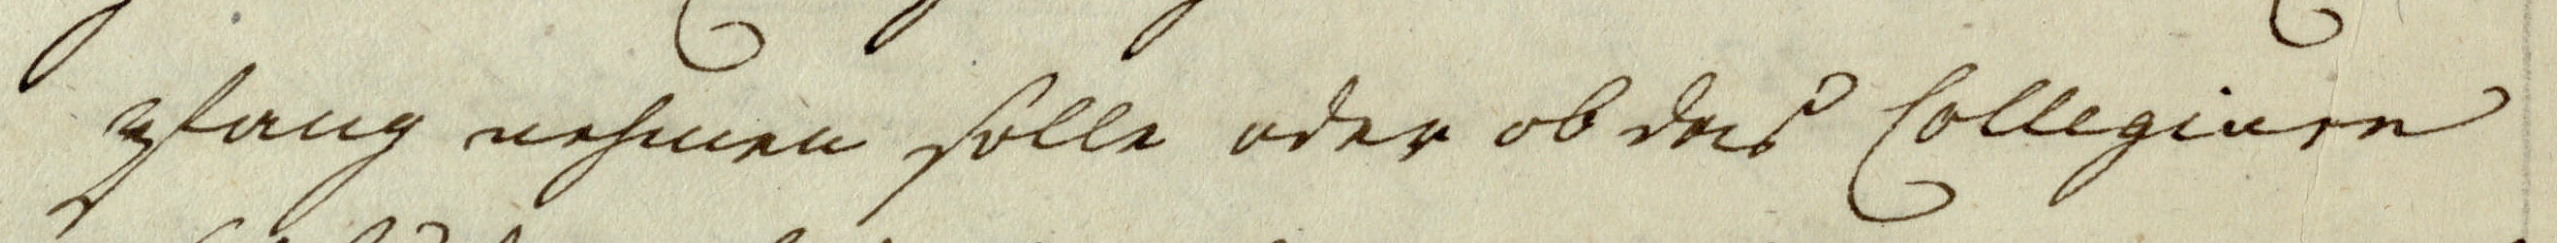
pfang nehmen solle oder ob das Collegium
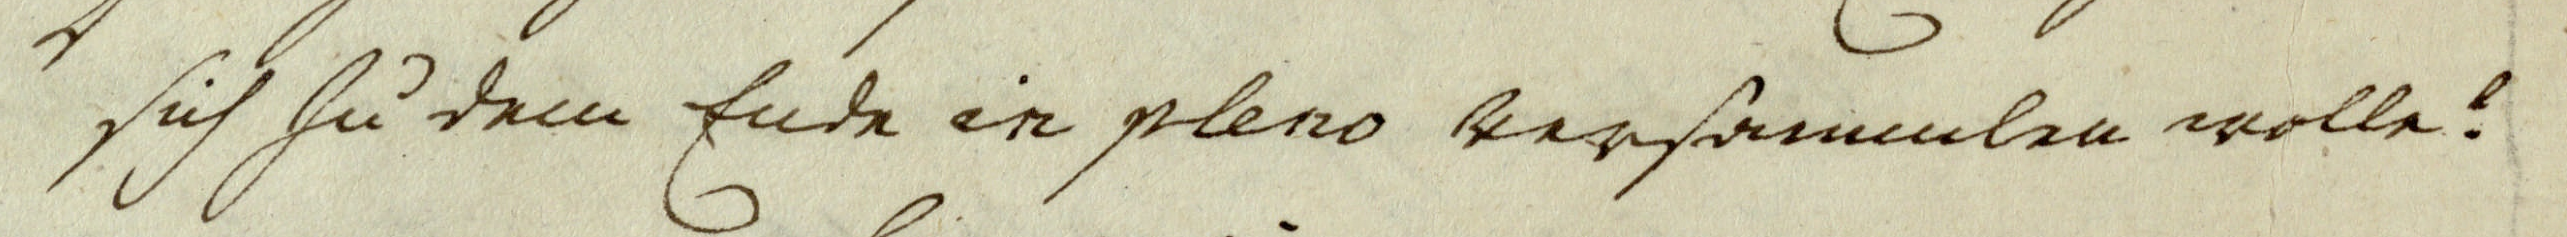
sich zu dem Ende in pleno versammeln wolle?
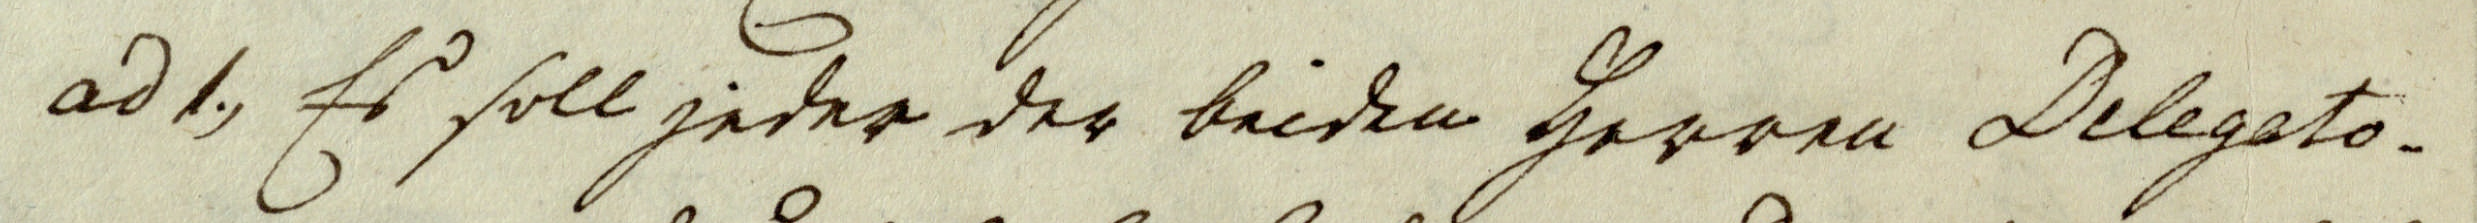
ad 1., Es soll jeder der beiden Herren Delegato¬
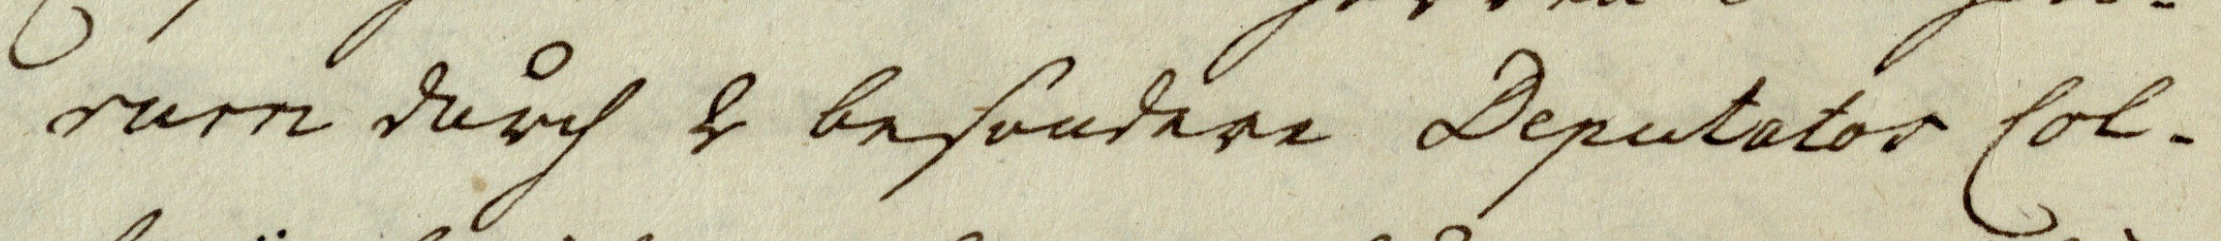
rum durch 2 besondere Deputatos Col¬
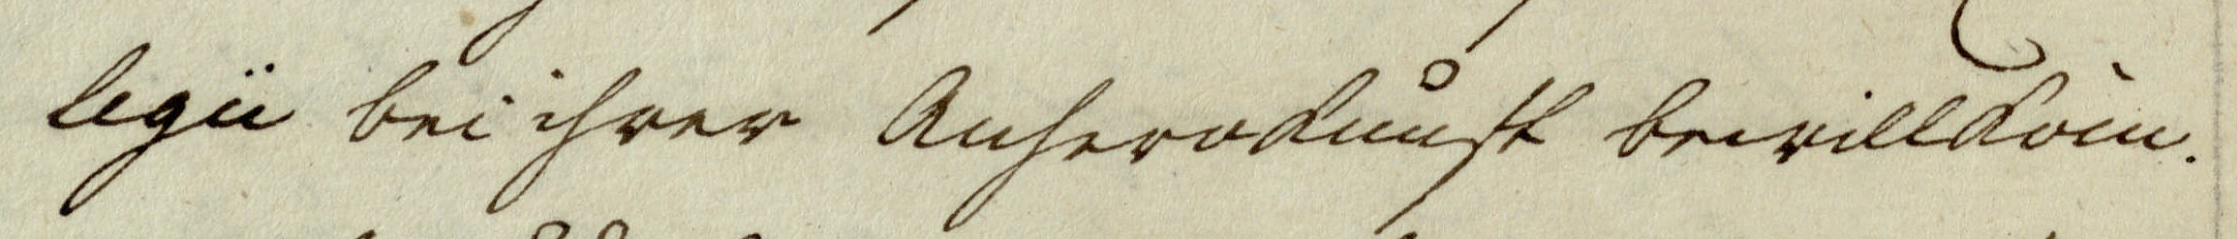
legii bei ihrer Anherokunft bewillkom¬
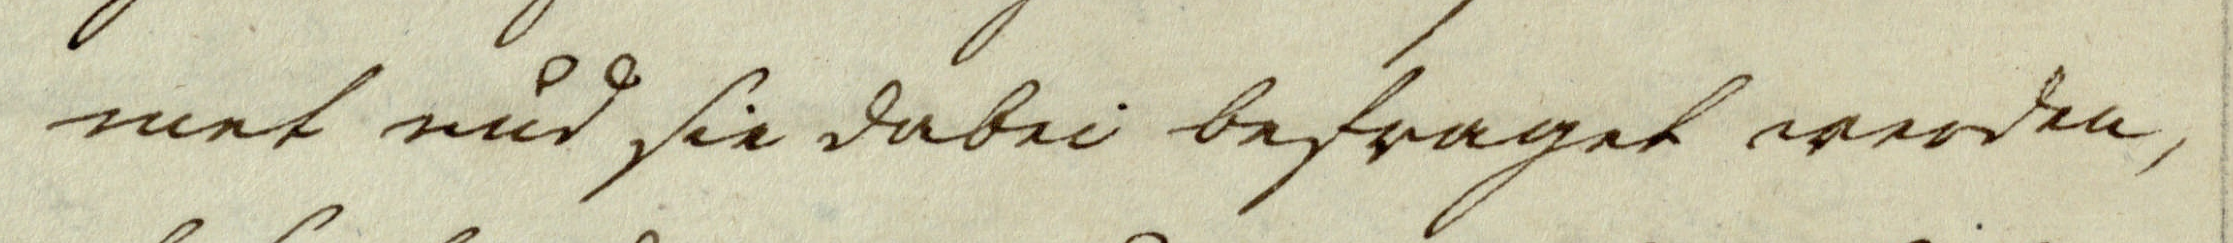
met und sie dabei befragt werden,
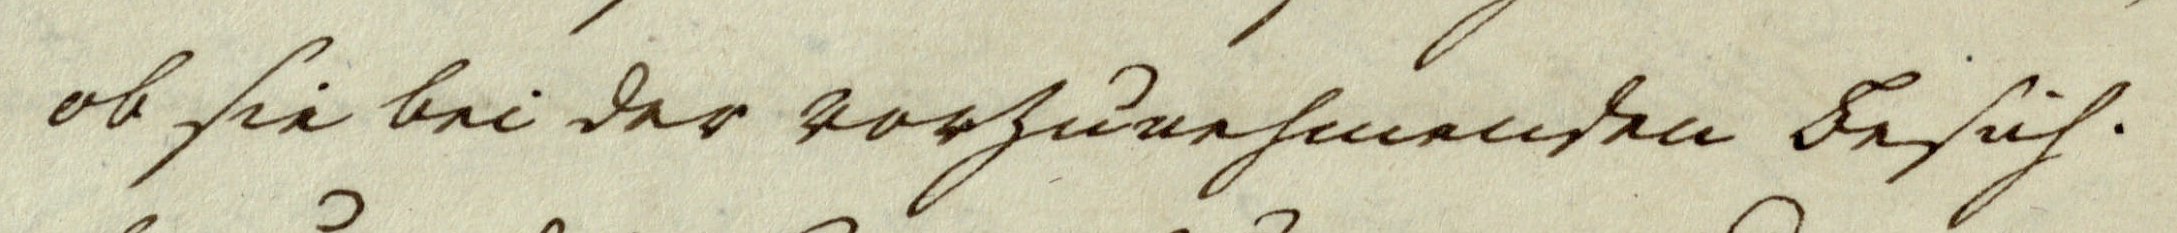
ob sie bei der vorzunehmenden Besich¬
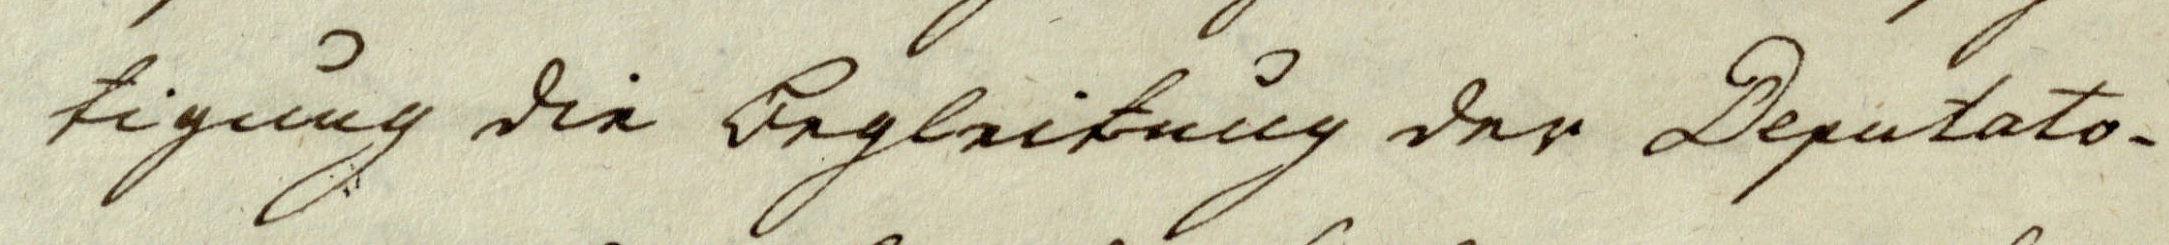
tigung die Begleitung der Deputato¬
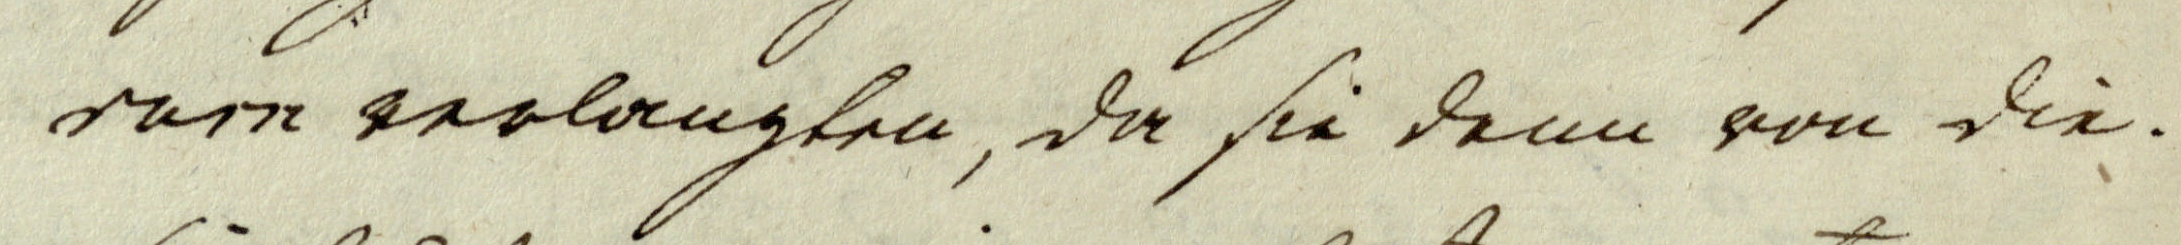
rum verlangten, da sie denn von die¬
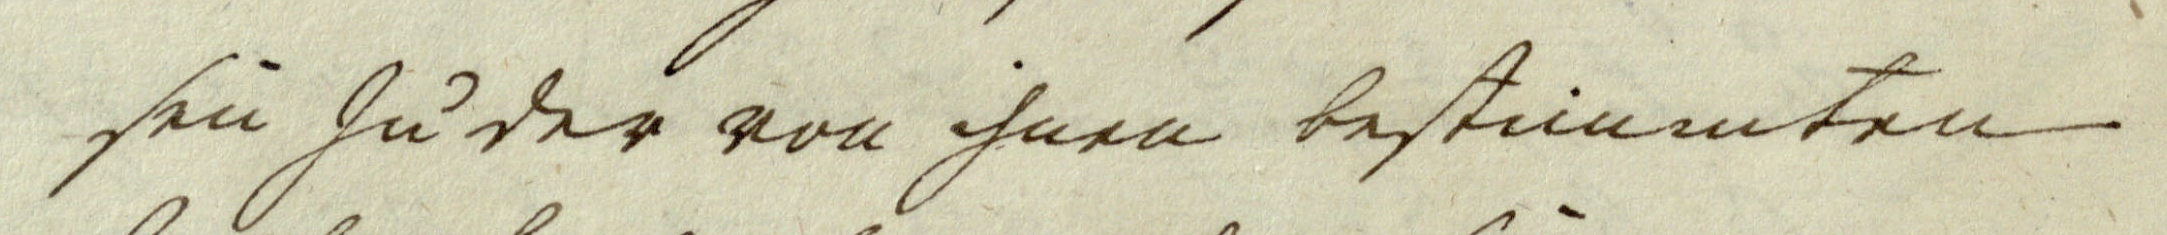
sen zu der von ihnen bestimmten
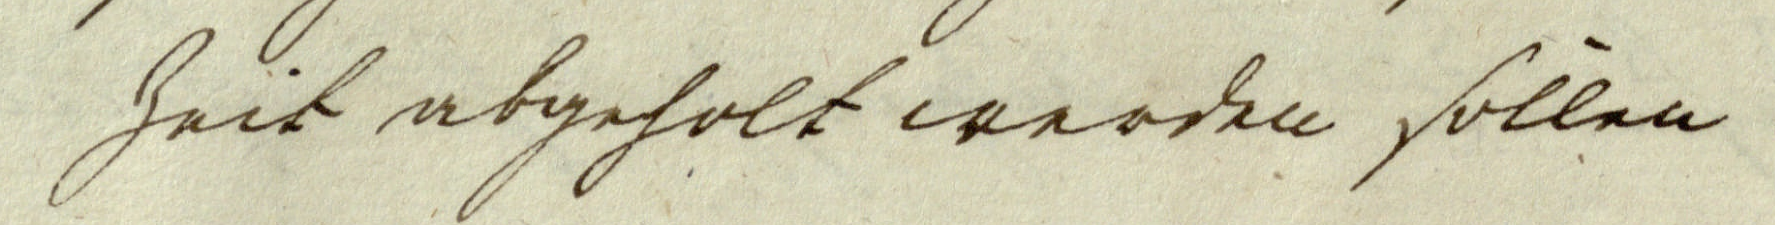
Zeit abgeholt werden sollen.
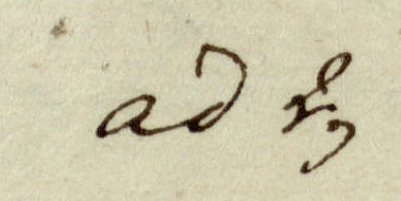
ad 2.,
